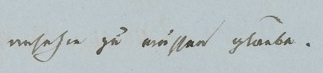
ansehen zu müssen glaube.
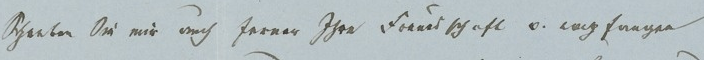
Schenken Sie mir auch ferner Ihre Freundschaft u. empfangen
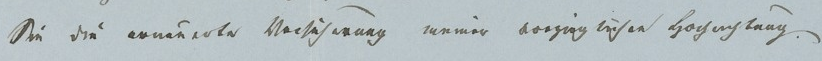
Sie die erneuerte Versicherung meiner vorzüglichen Hochachtung.
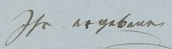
Ihr ergebener
